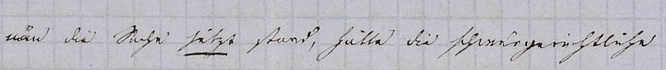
nun die Sache jetzt stand, hätte die schwurgerichtliche
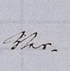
Ver-
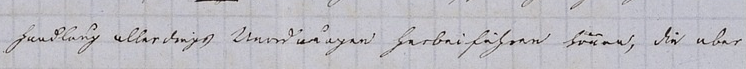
handlung allerdings Unordnungen herbeiführen können, die aber
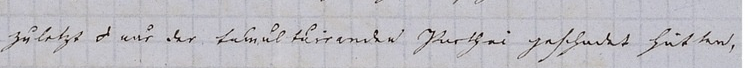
zuletzt nur der tumultirenden Parthei geschadet hätten,
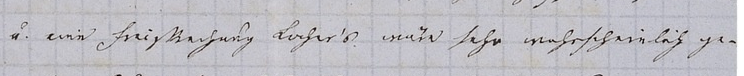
u. eine Freisprechung Locher's wäre sehr wahrscheinlich ge-
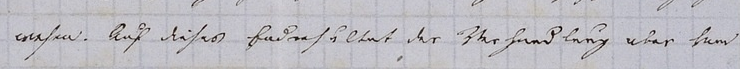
wesen. Auf dieses Endresultat der Verhandlung aber kam
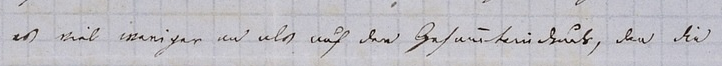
es viel weniger an als auf den Gesammteindruck, den die
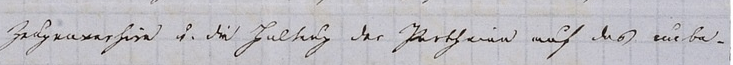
Zeugenverhöre u. die Haltung der Partheien auf das unbe-
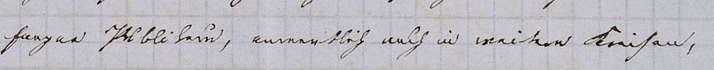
fangne Publikum, namentlich auch in weitern Kreisen,
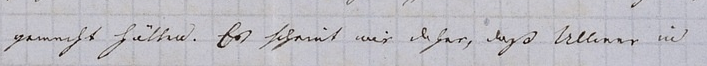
gemacht hätten. Es scheint mir daher, daß Ullmer in
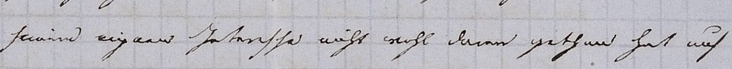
seinem eignen Interesse nicht wohl daran gethan hat auf
